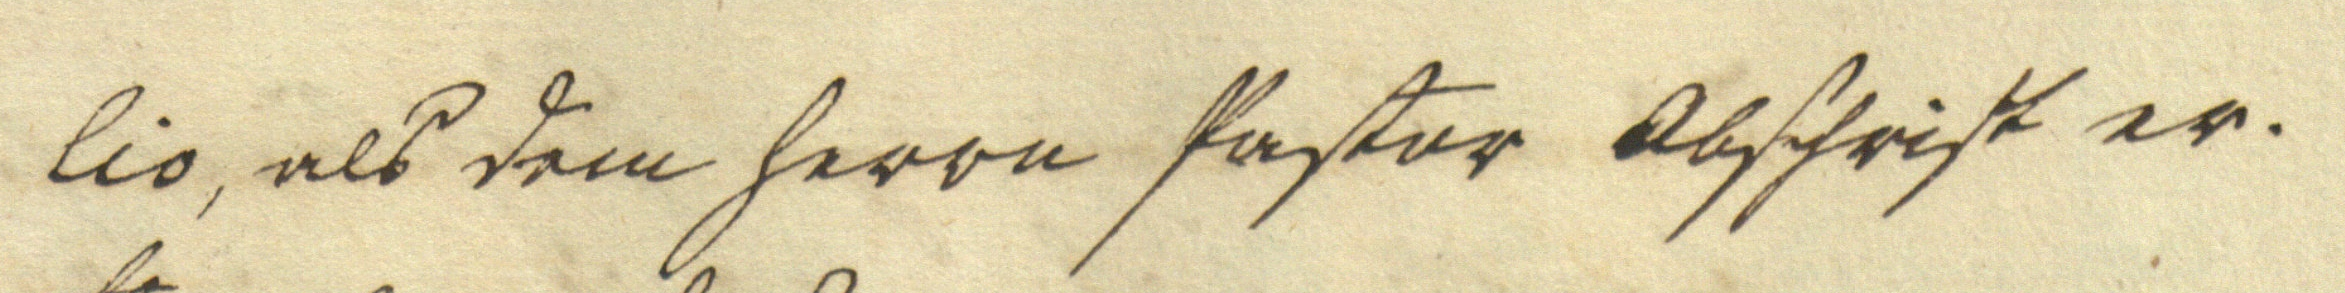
lio, als dem Herrn Pastor Abschrift er¬
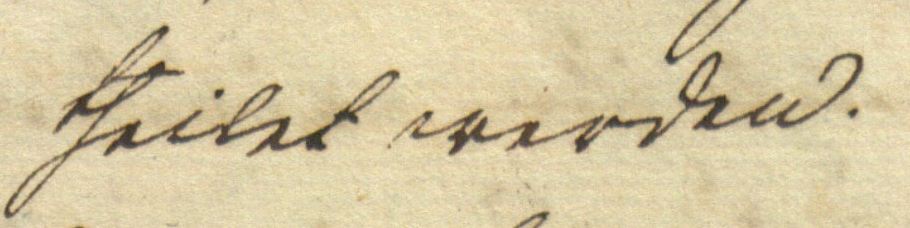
theilet werden.
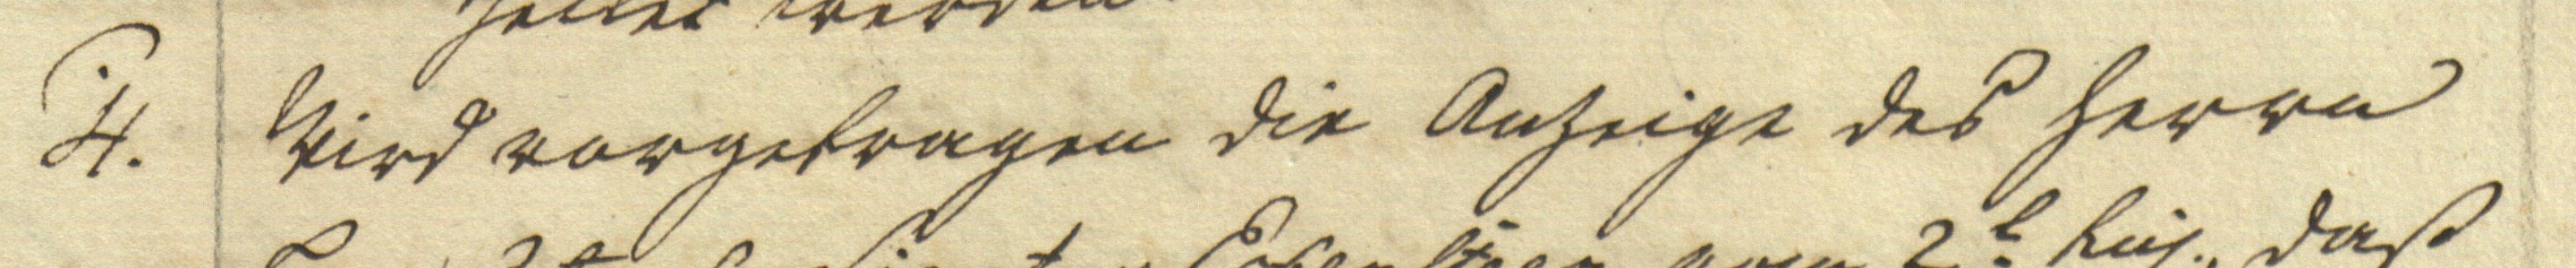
4. Wird vorgetragen die Anzeige des Herrn
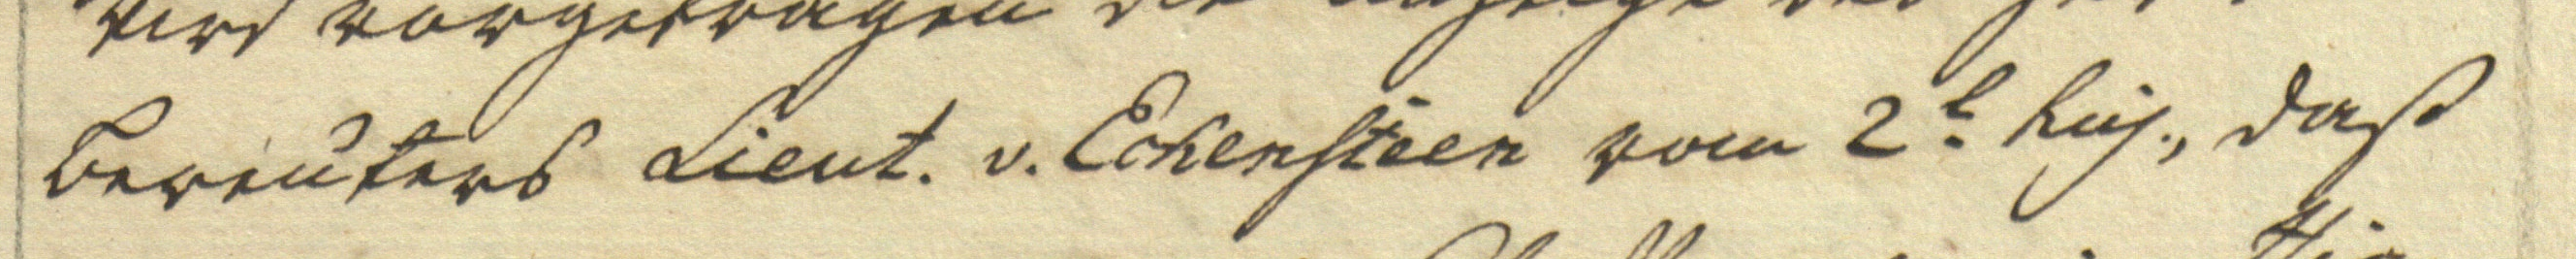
Bereuters Lieut. v. Eckensteen vom 2 t huj., daß
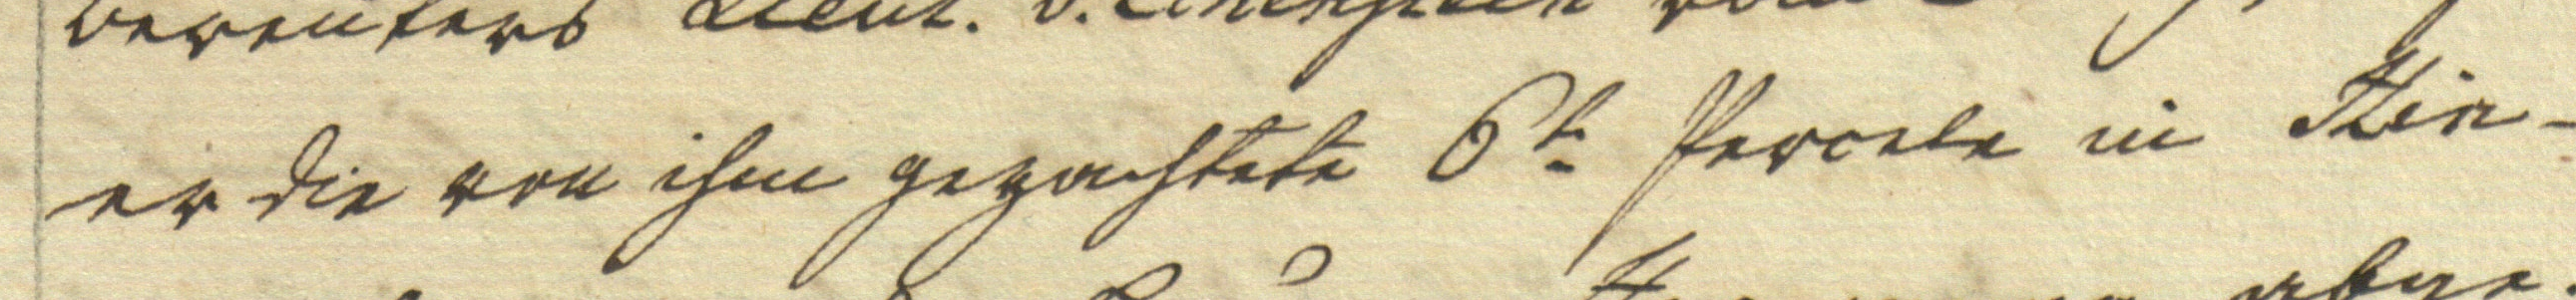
er die von ihm gepachtete 6 t. Percele in Hin¬
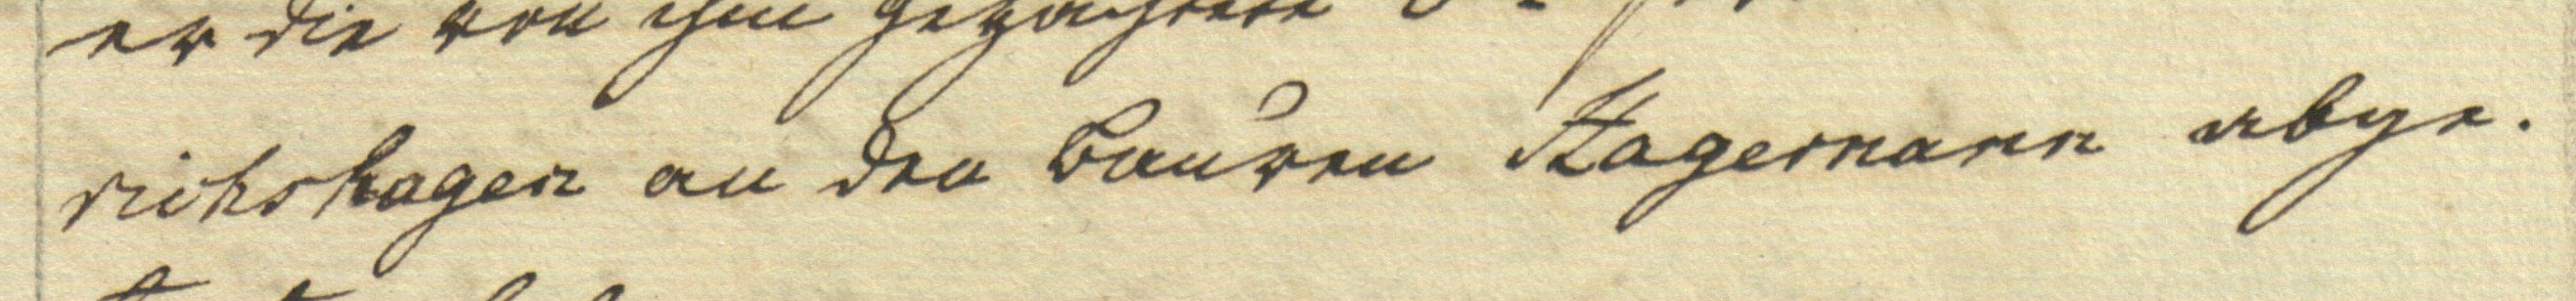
richshagen an den Bauren Hagemann abge¬
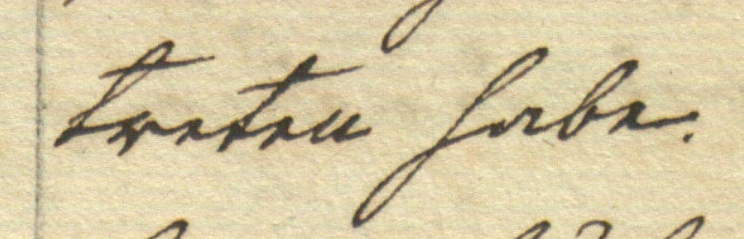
treten habe.
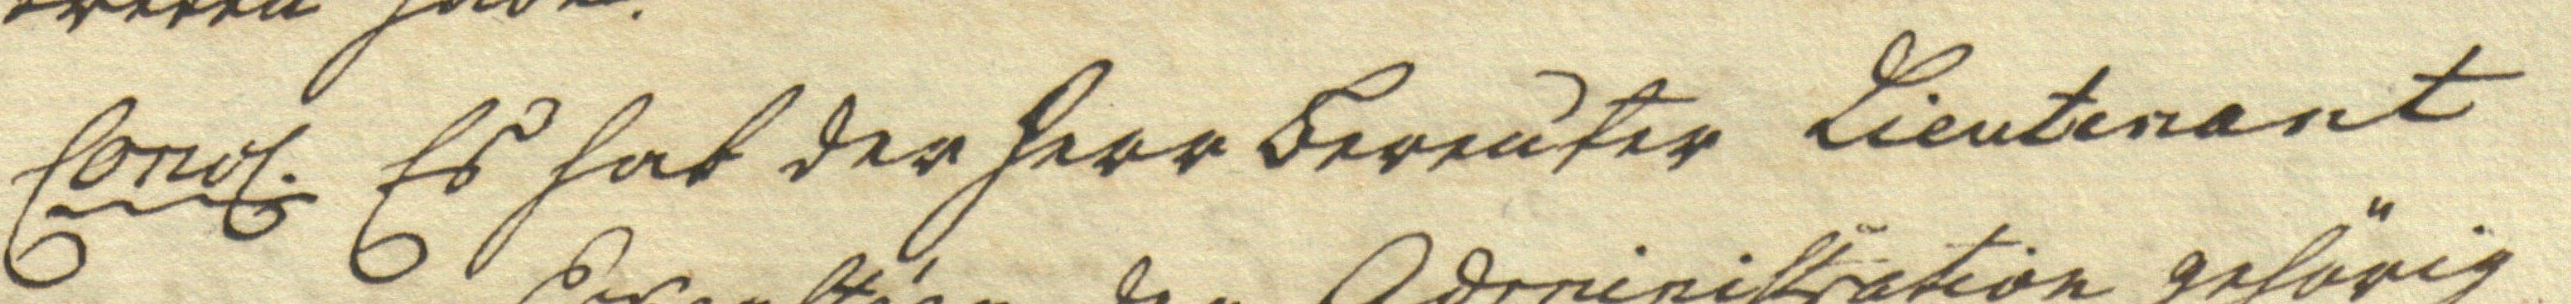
Concl. Es hat der Herr Bereuter Lieutenant
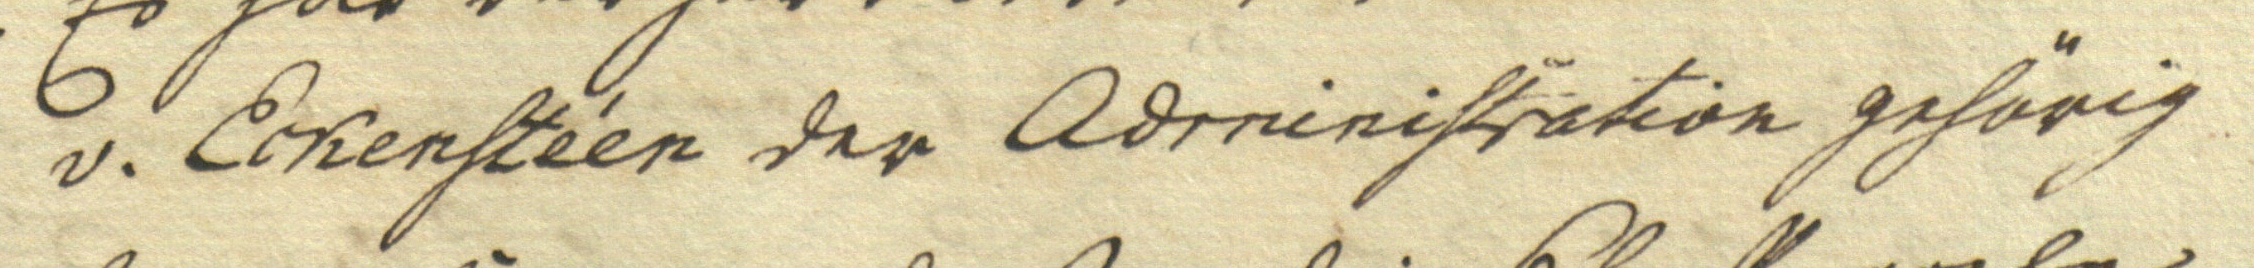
v. Eckenstéen der Administration gehörig
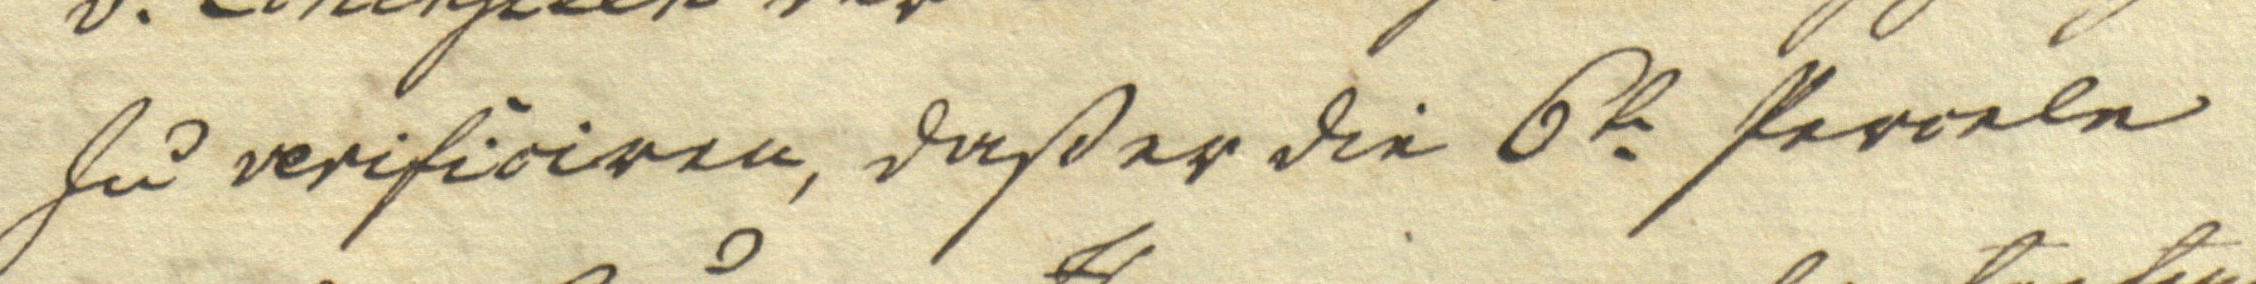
zu verificiren, daß er die 6 t Percelen
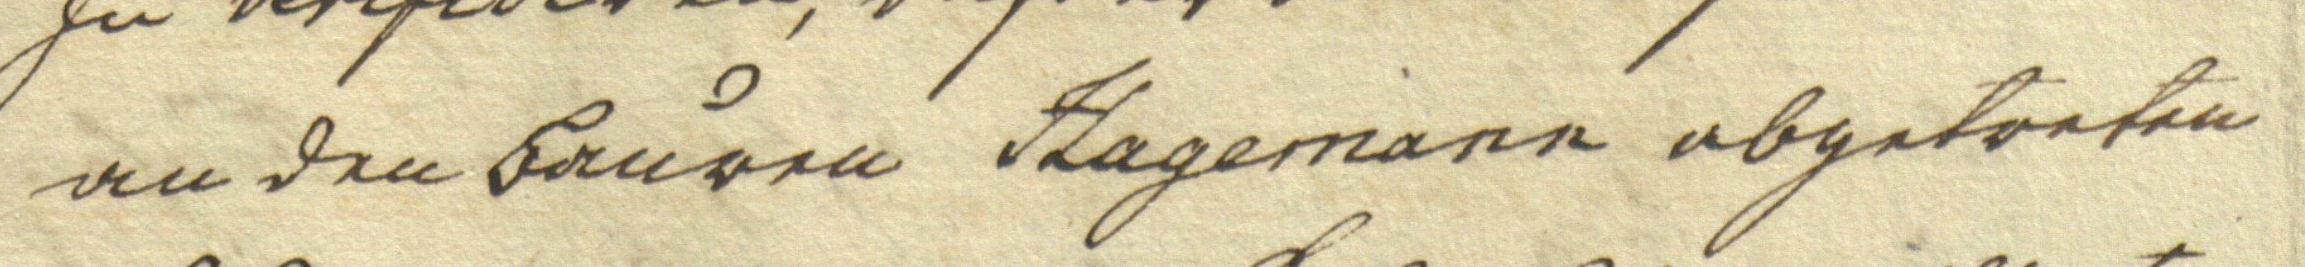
an den Bauren Hagemann abgetreten
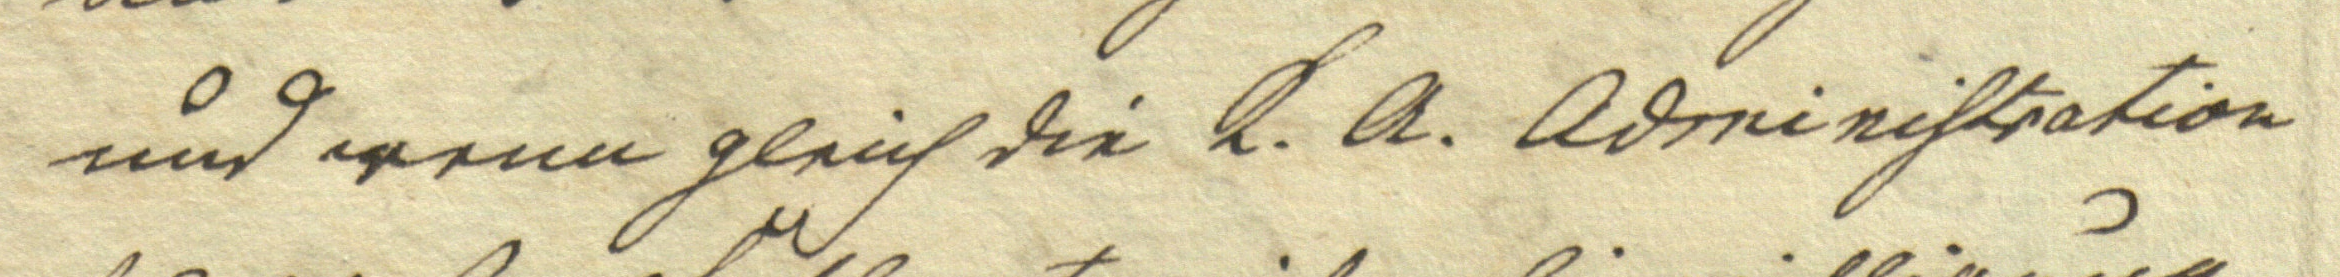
und wenn gleich die K. A. Administration
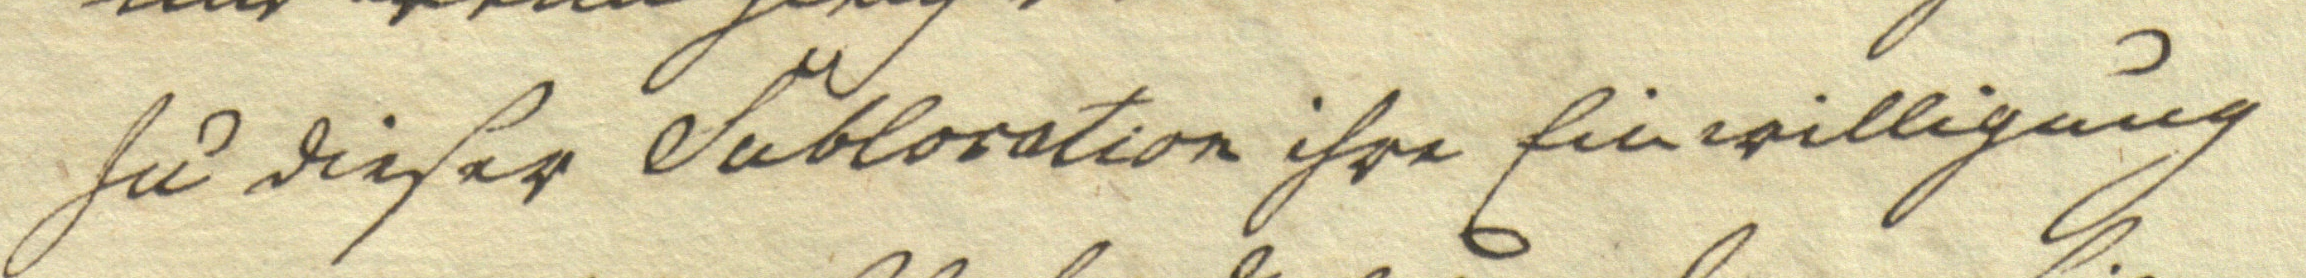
zu dieser Sublocation ihre Einwilligung
